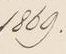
1869.
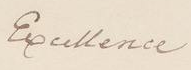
Excellence
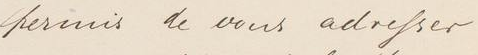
permis de vous adresser
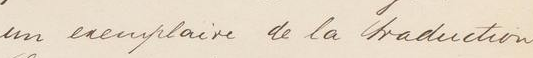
un exemplaire de la traduction
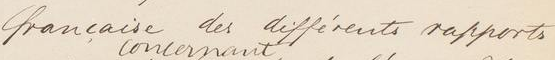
française des différents rapports
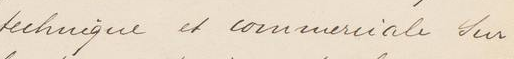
technique et commerciale sur
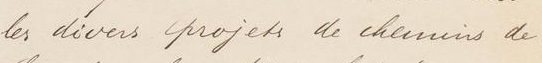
les divers projets de chemins de
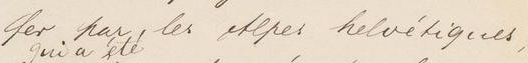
fer par les Alpes helvétiques,
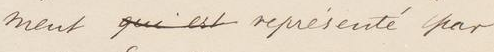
ment qui est représenté par
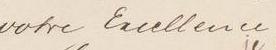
votre Excellence.
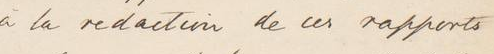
à la redaction de ces rapports
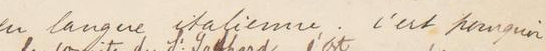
en langue italienne. C'est pourqui
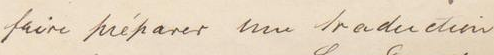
faire préparer une traduction
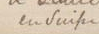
en Suisse
